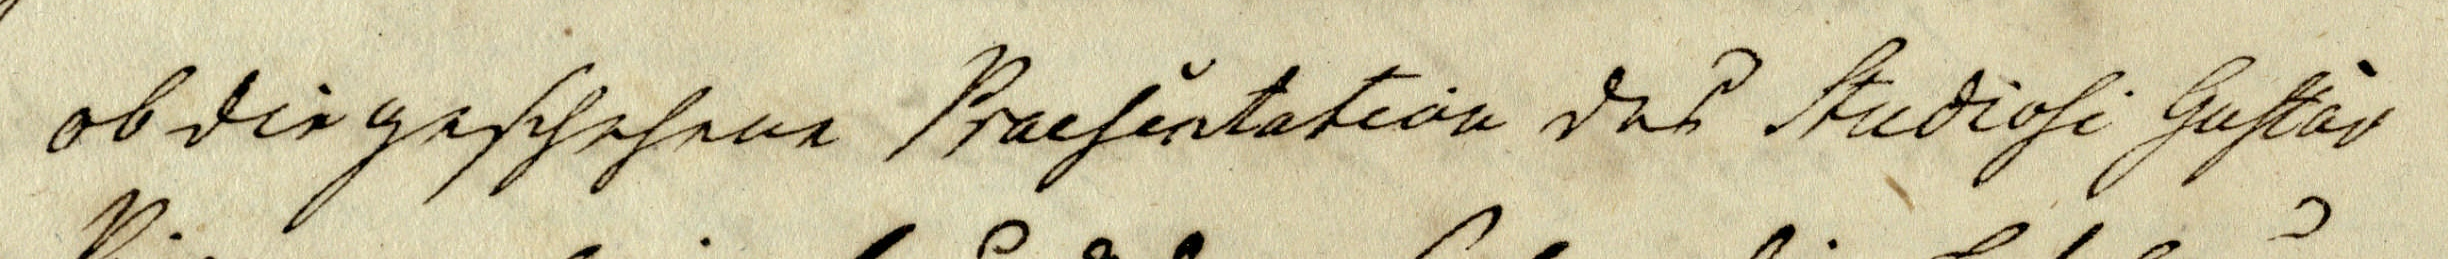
ob die geschehene Praesentation das Studiosi Gustav
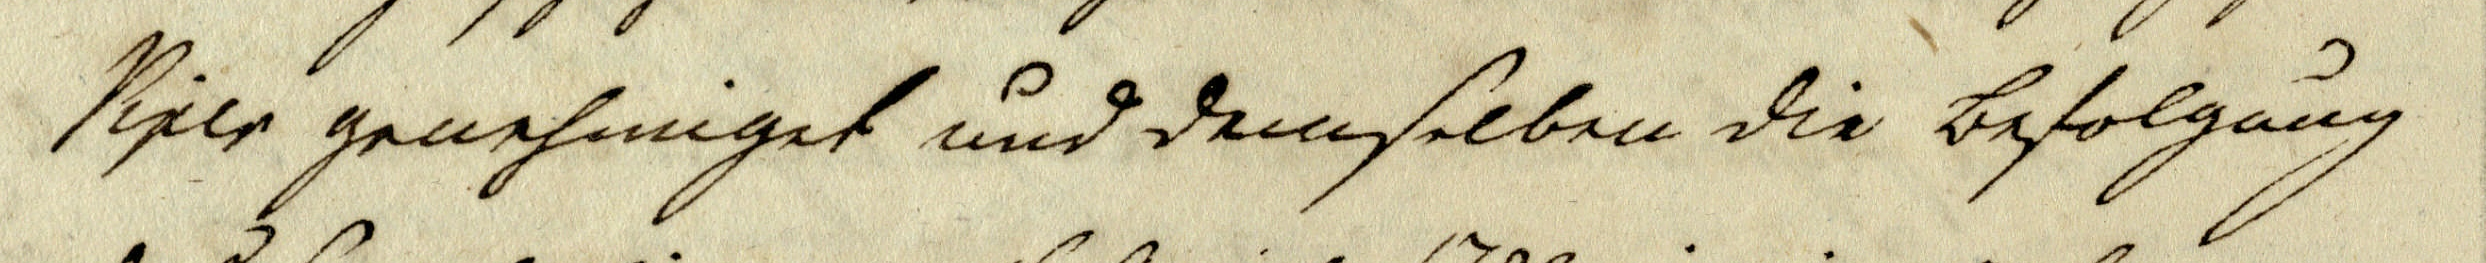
Piper genehmiget und demselben die Befolgung
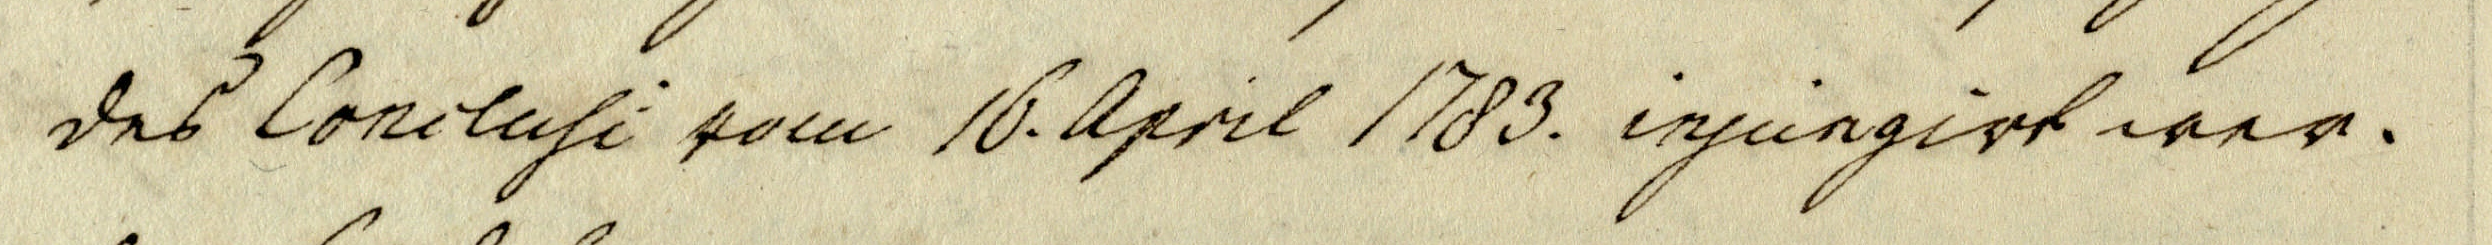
des Conclusi vom 16. April 1783. injungirt wer¬
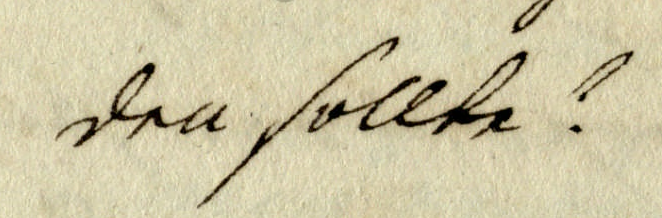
den sollte?
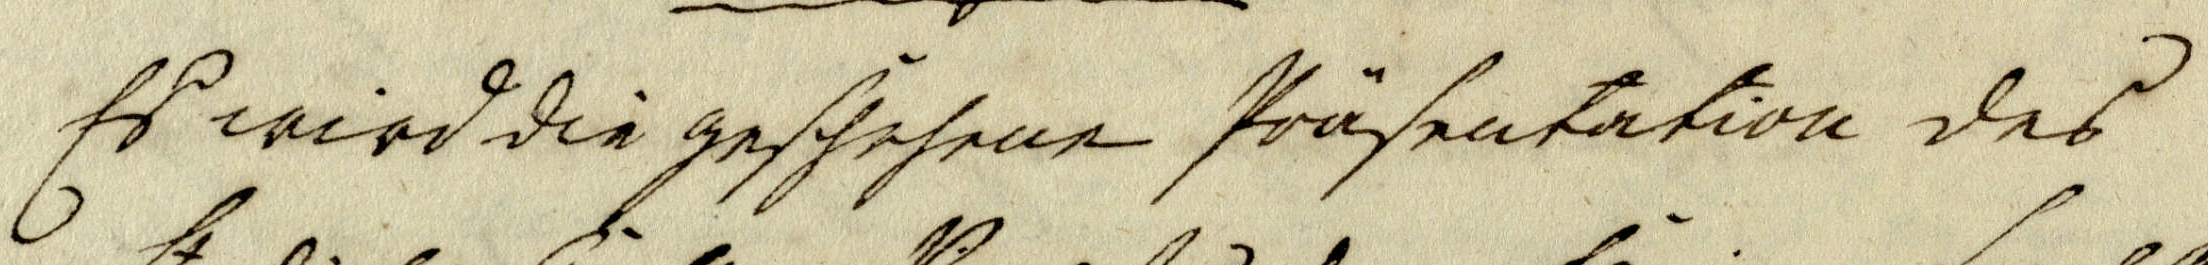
Es wird die geschehene Präsentation des
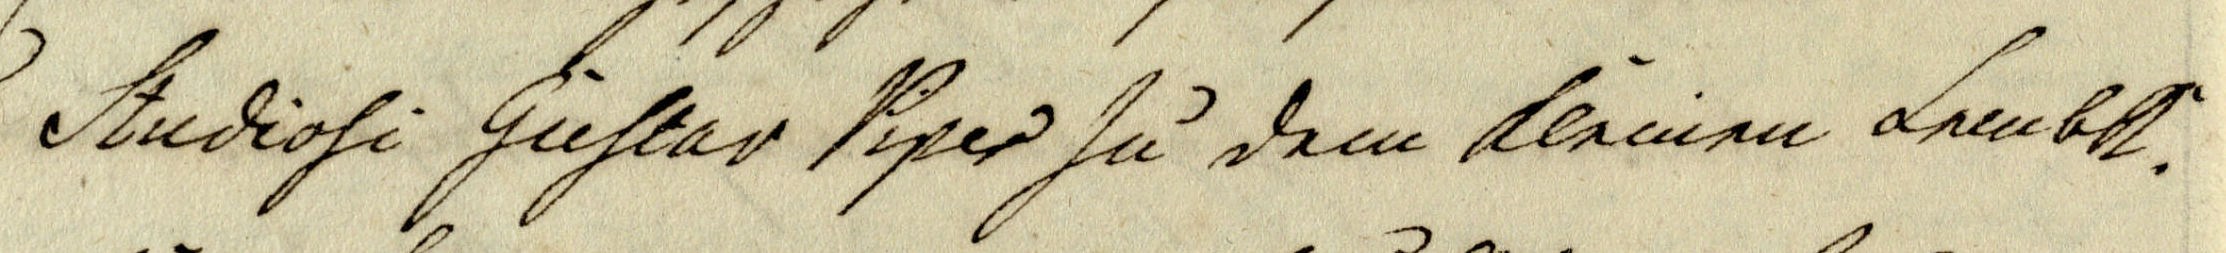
Studiosi Gustav Piper zu dem kleinen Lembk¬
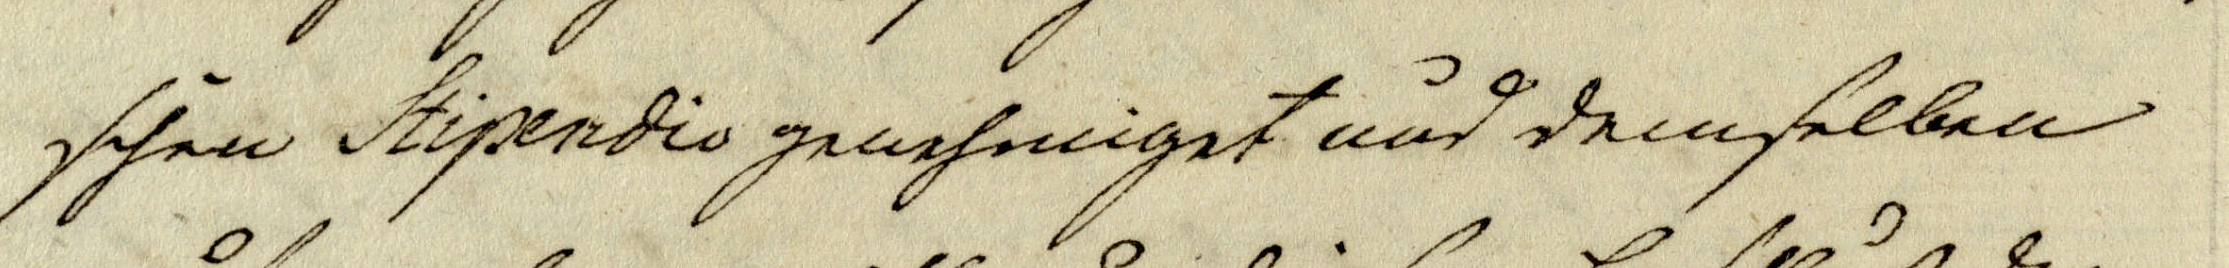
schen Stipendio genehmiget und demselben
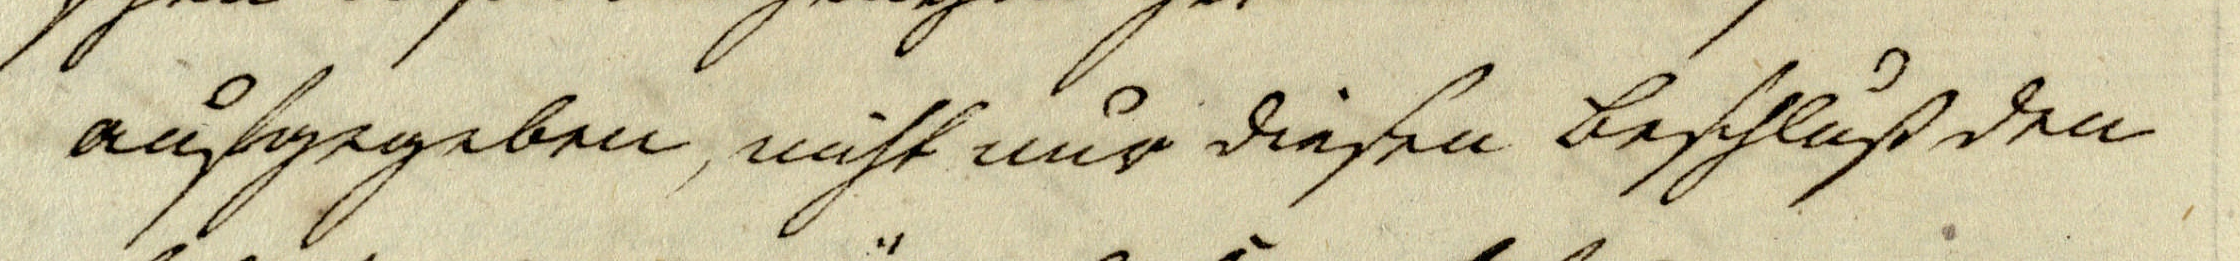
aufgegeben, nicht nur diesen Beschluß den
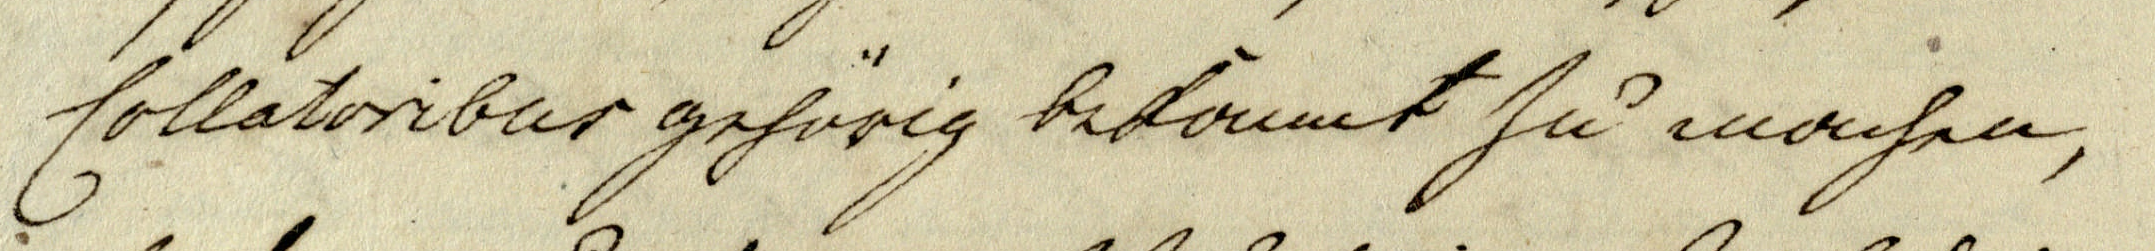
Collatoribus gehörig bekannt zu machen,
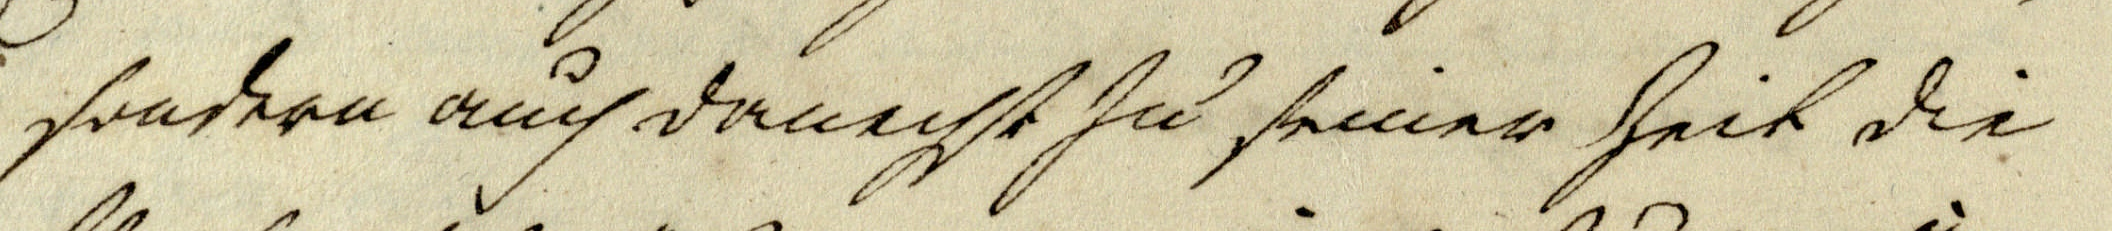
sondern auch danechst zu seiner Zeit die
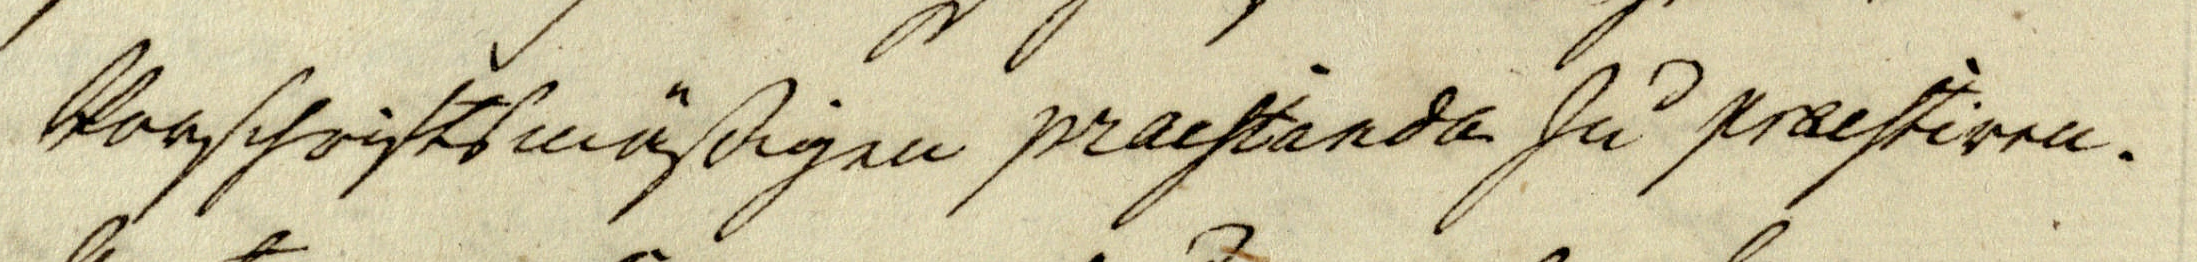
Vorschriftsmäßigen praestanda zu praestiren.
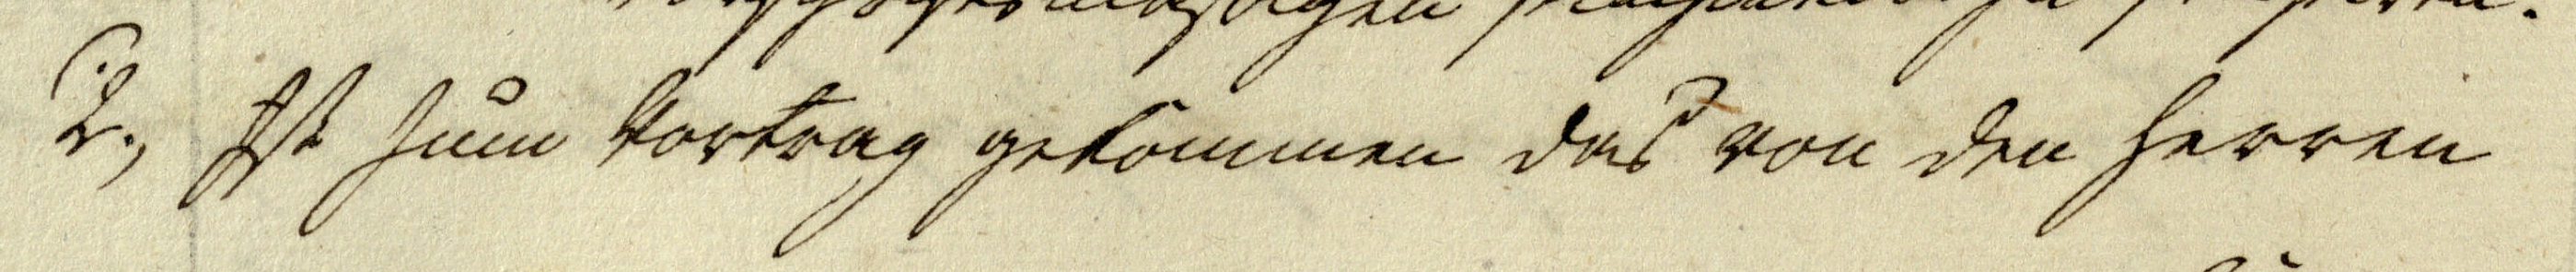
2., Ist zum Vortrag gekommen das von den Herren
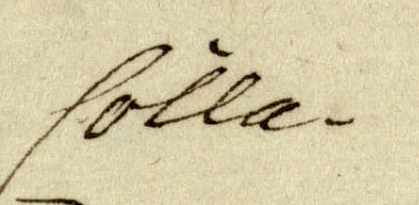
Colla¬
